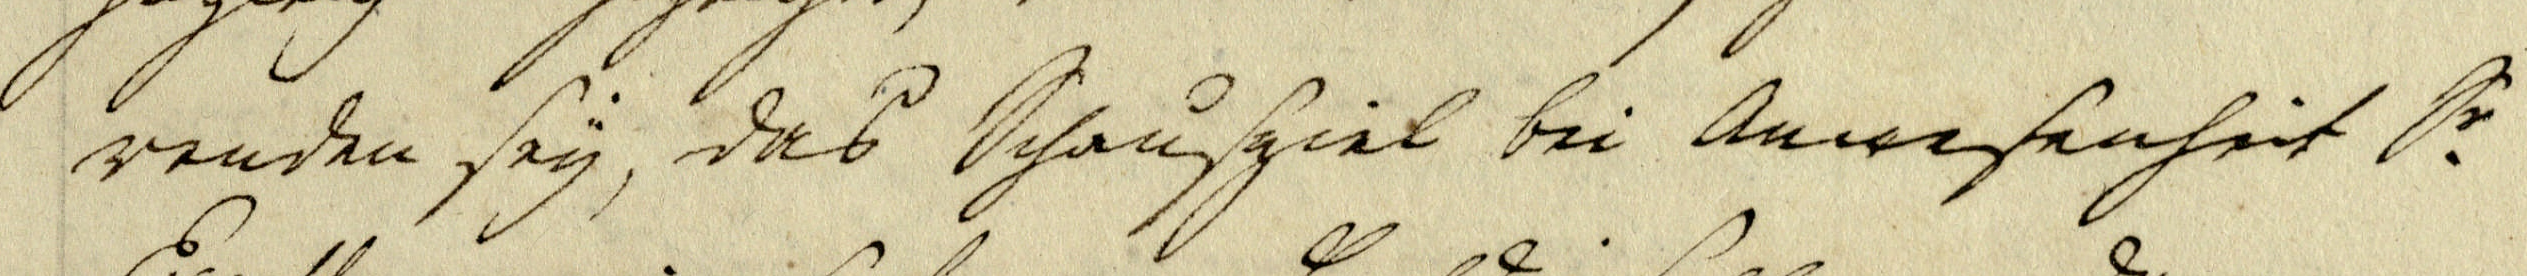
renden seÿ, das Schauspiel bei Anwesenheit Sr
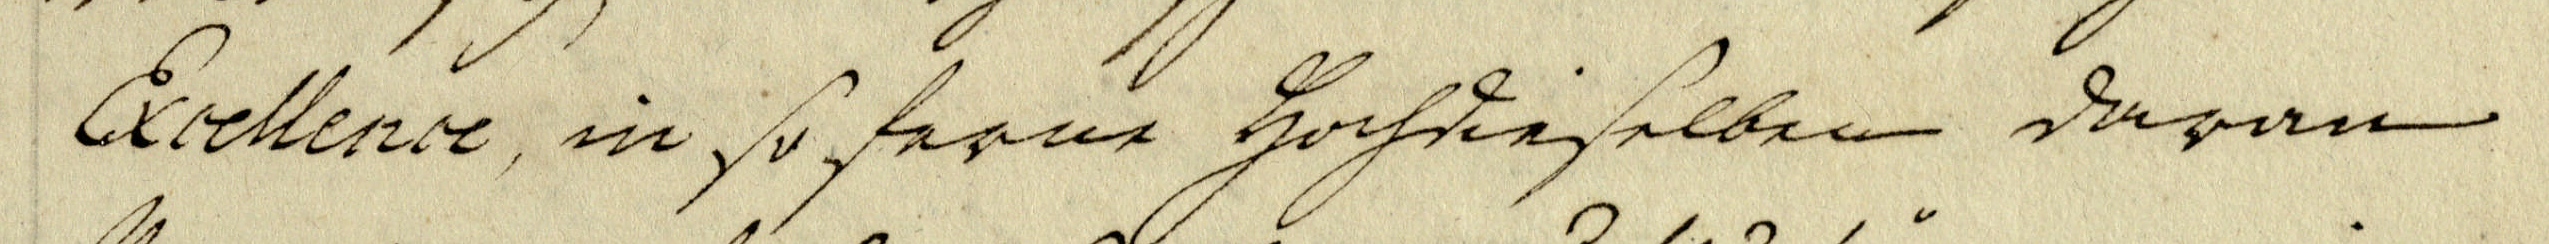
Excellence, in so ferne Hochdieselben daran
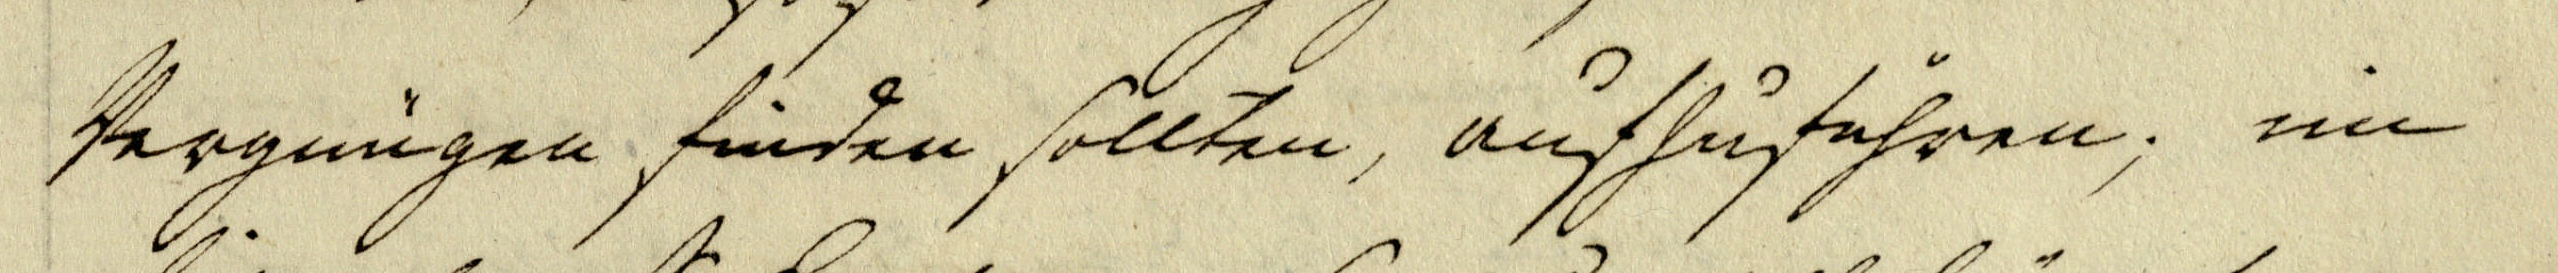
Vergnügen finden sollten, aufzuführen; im
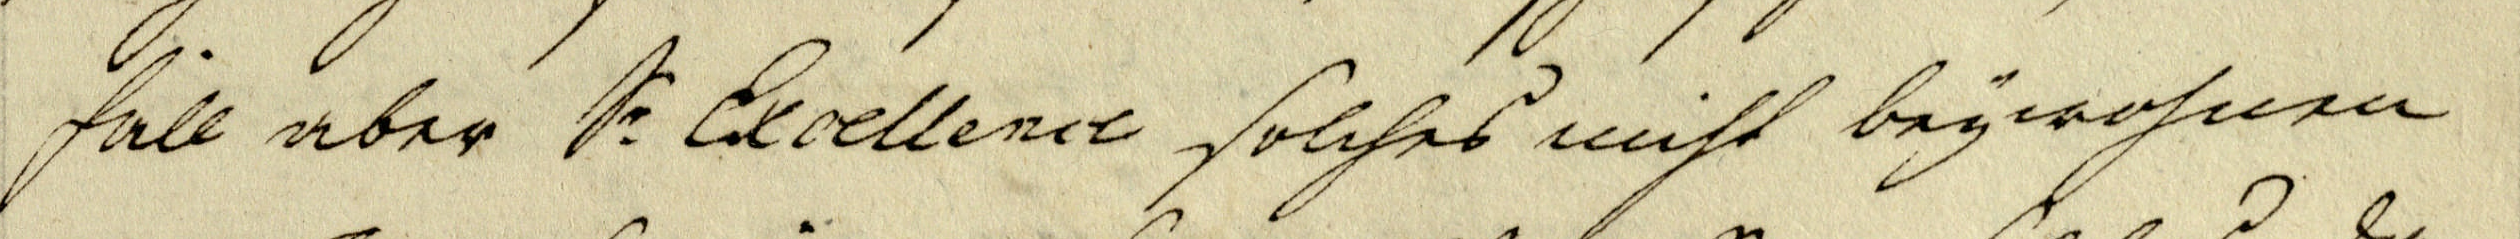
Fall aber Sr Excellence solches nicht beÿwohnen
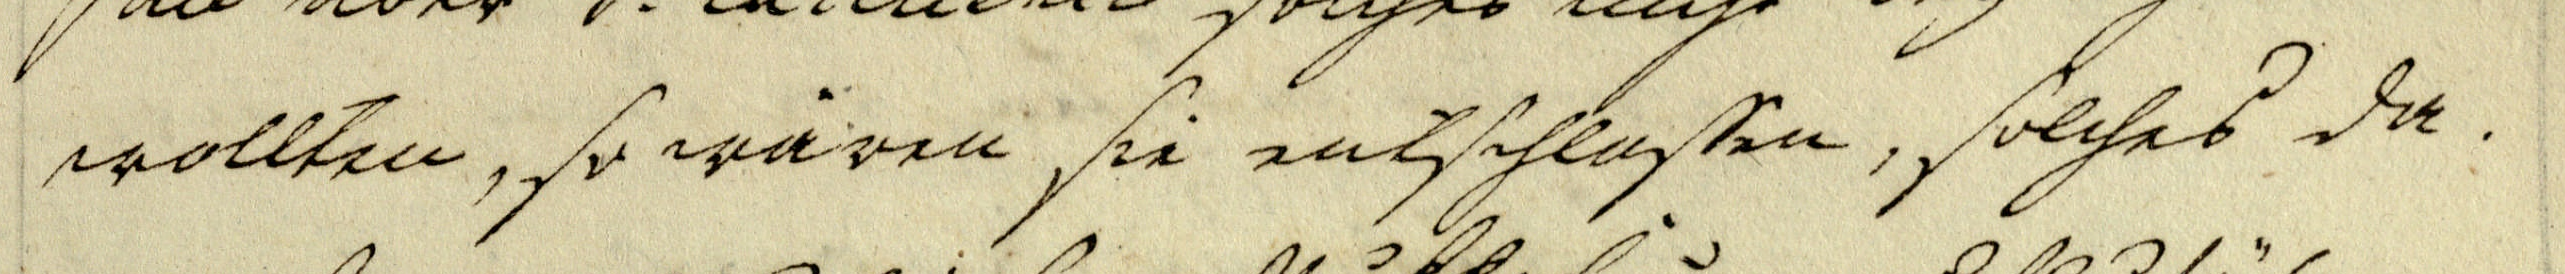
wollten, so wären sie entschlossen, solches da¬
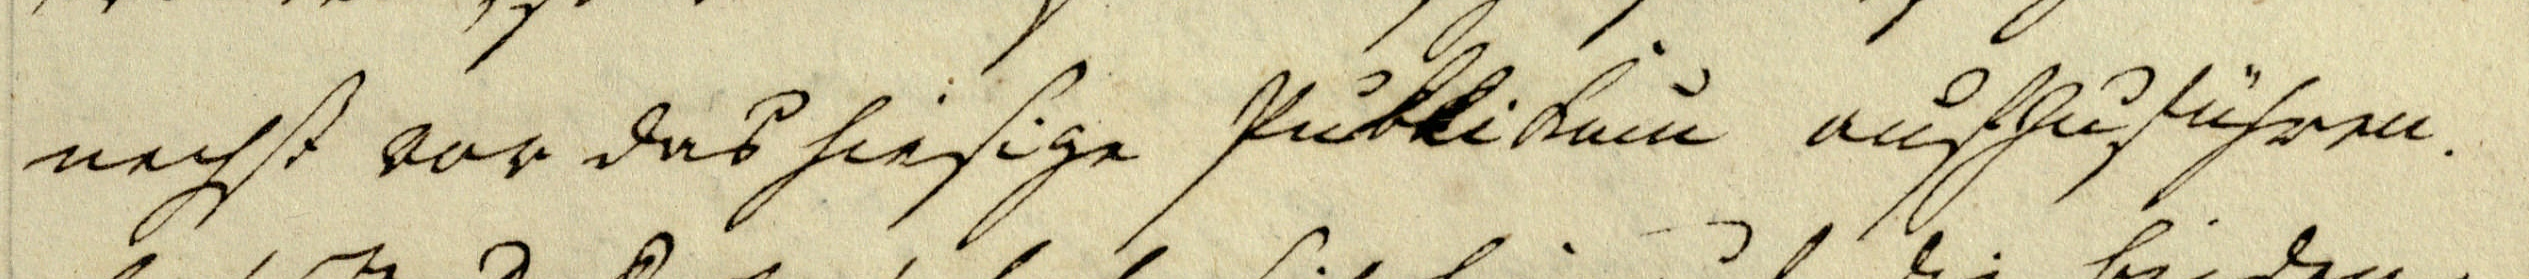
nechst vor das hiesige Publikum aufzuführen.
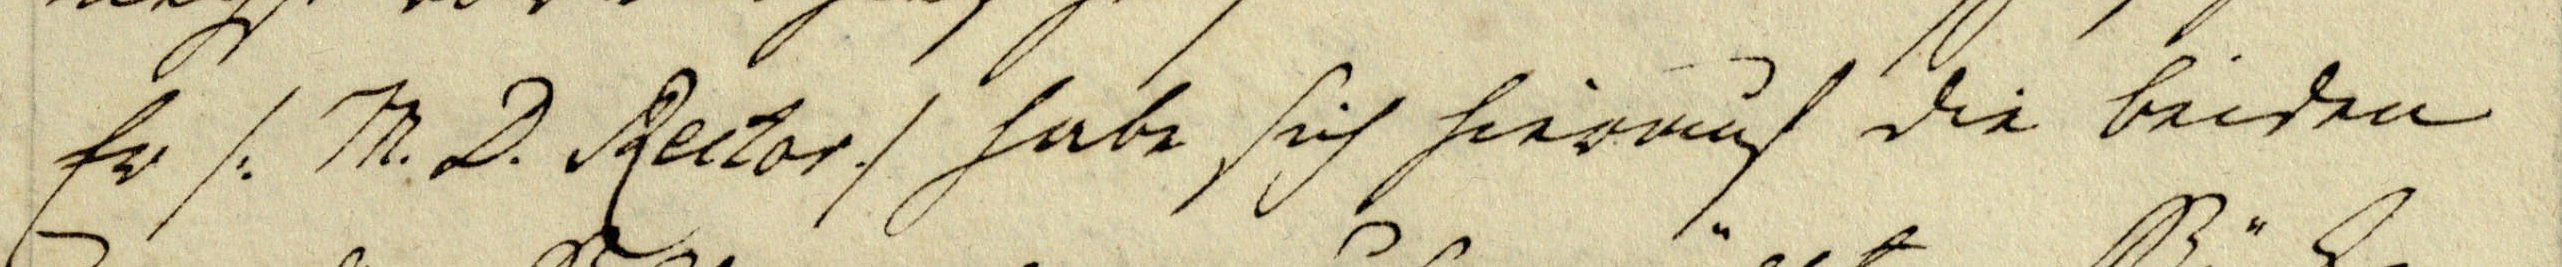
Er /. M. D. Rector ./ habe sich hierauf die beiden
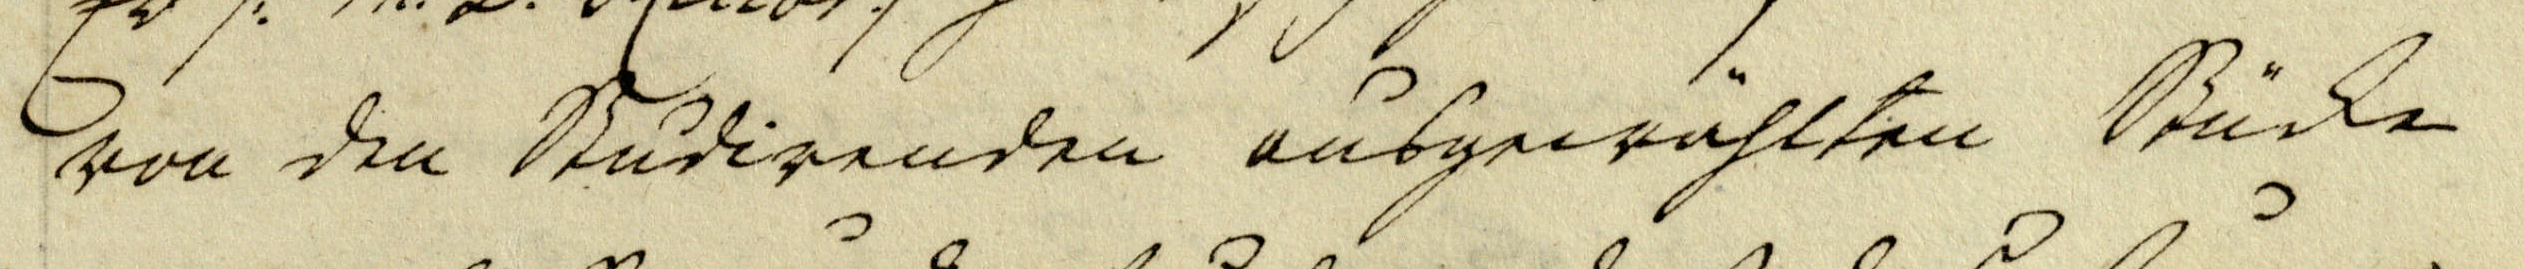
von den Studirenden ausgewählten Stücke
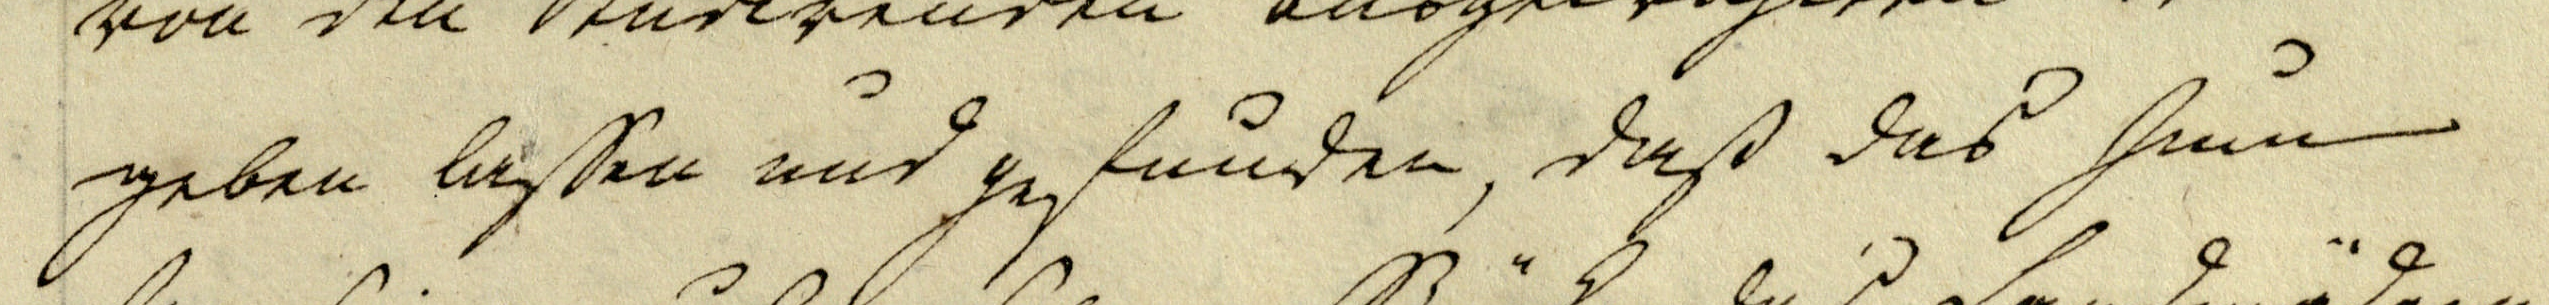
geben lassen und gefunden, daß das zum
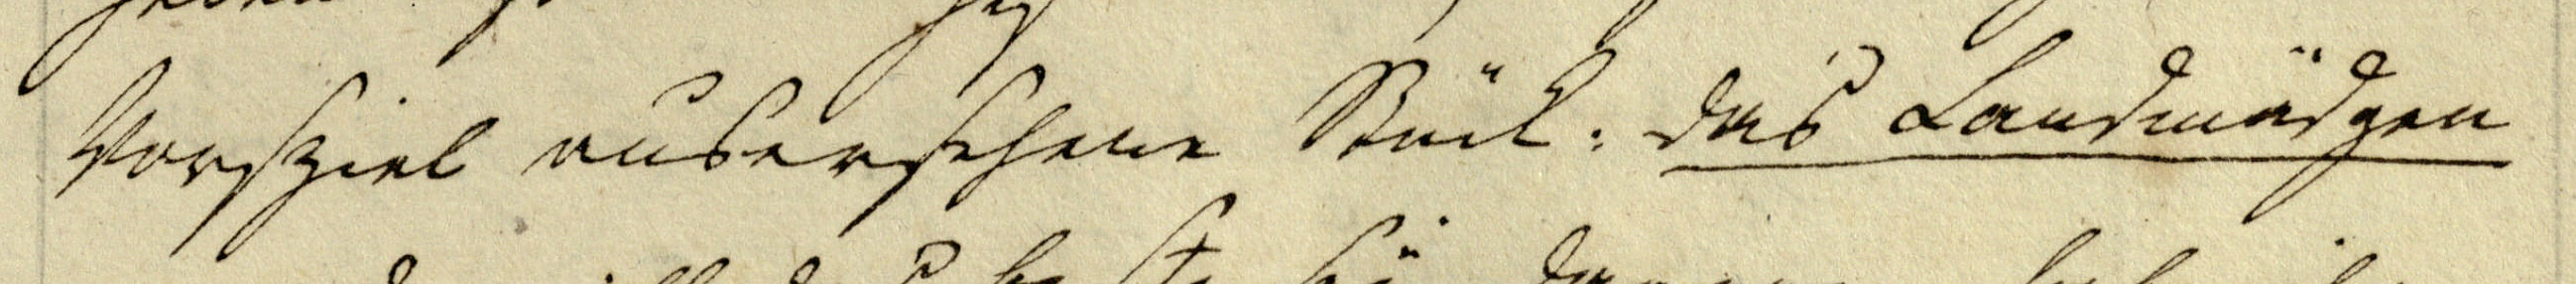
Vorspiel ausersehene Stück: das Landmädgen
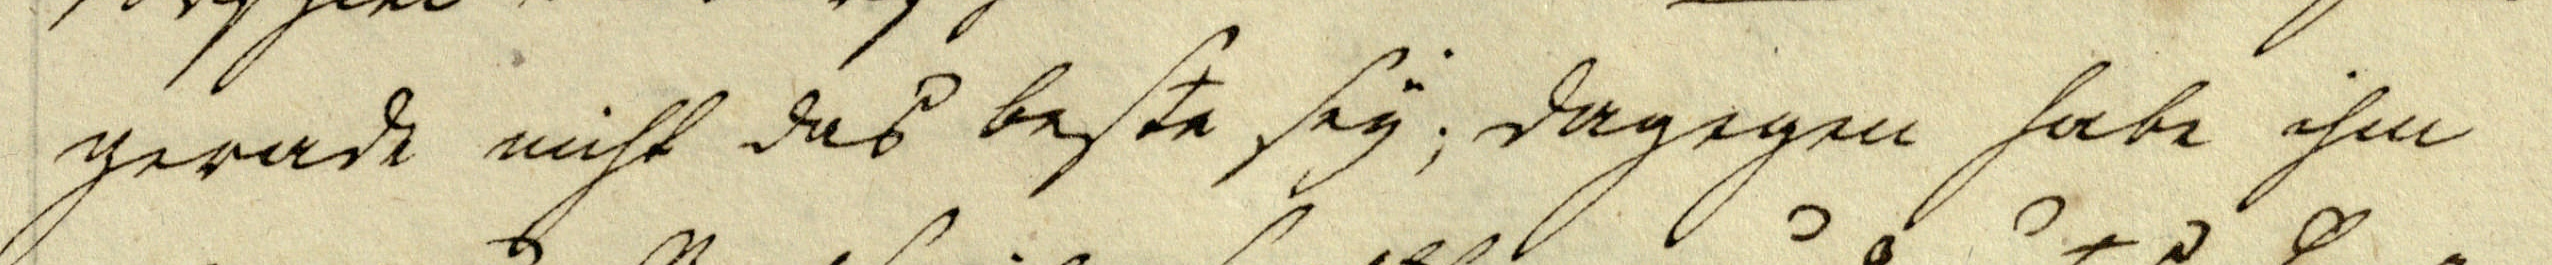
gerade nicht das beste seÿ, dagegen habe ihm
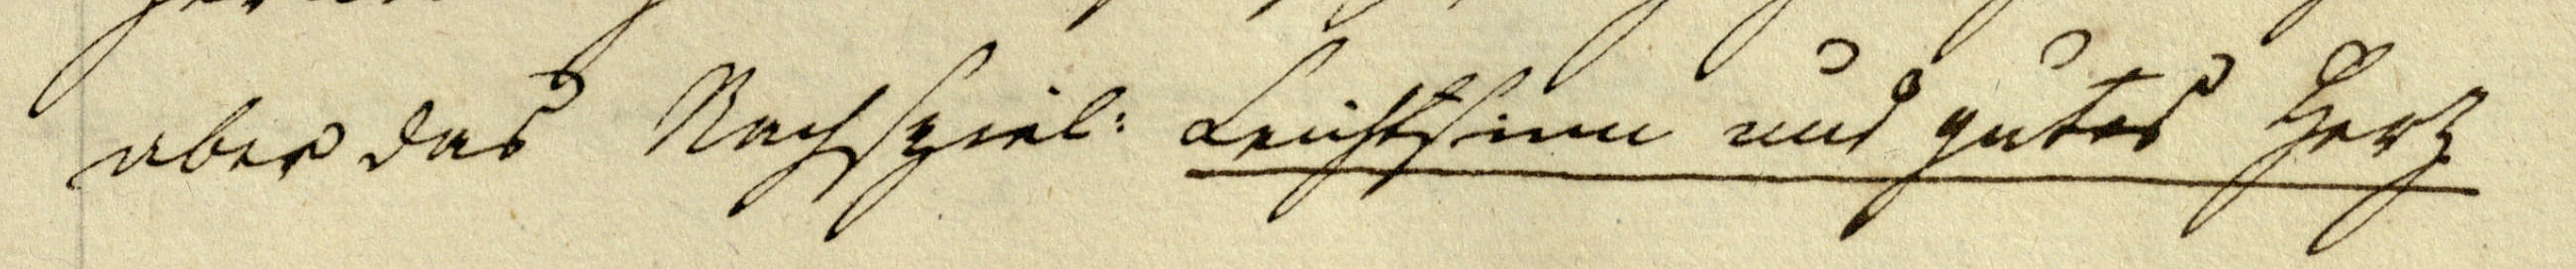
aber das Nachspiel: Leichtsinn und gutes Herz
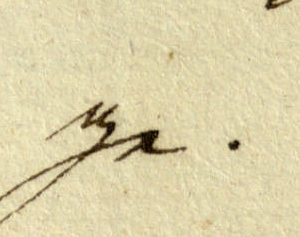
ge
